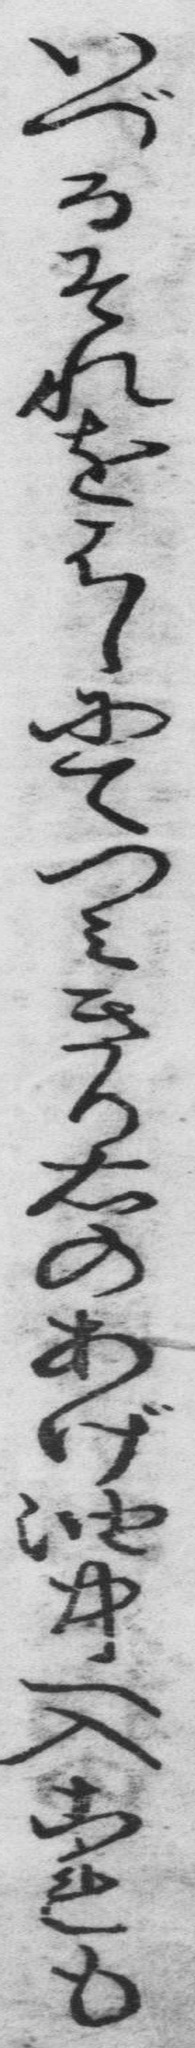いづるそれをはし尓てつみきり右のあげ油中へ入古連も
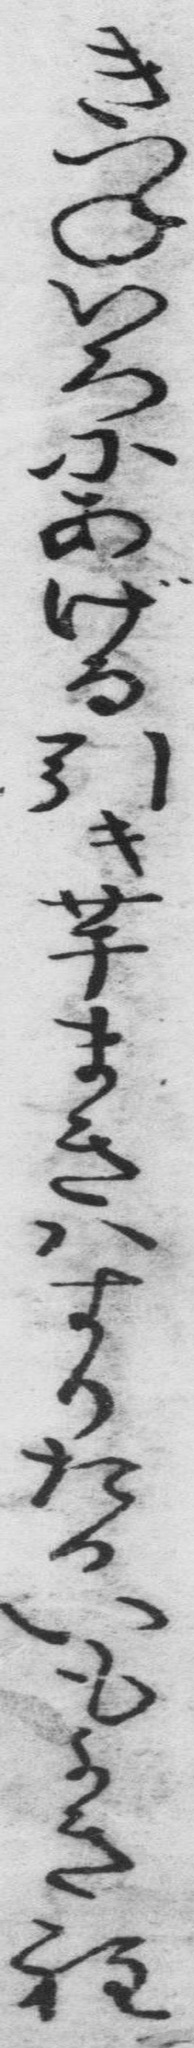きつ年いろ尓あげる引キ芋まきはすりたるいもよき程
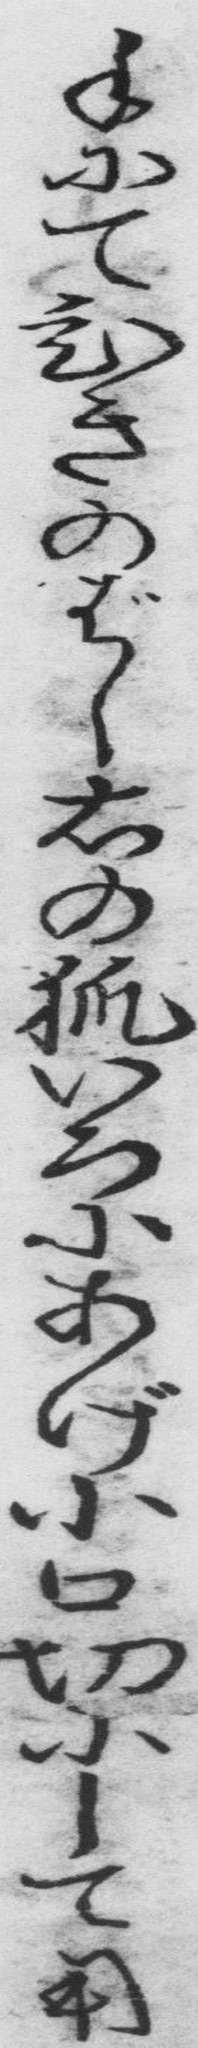手尓て飛きのばし右の狐いろ尓あげ小口尓して用
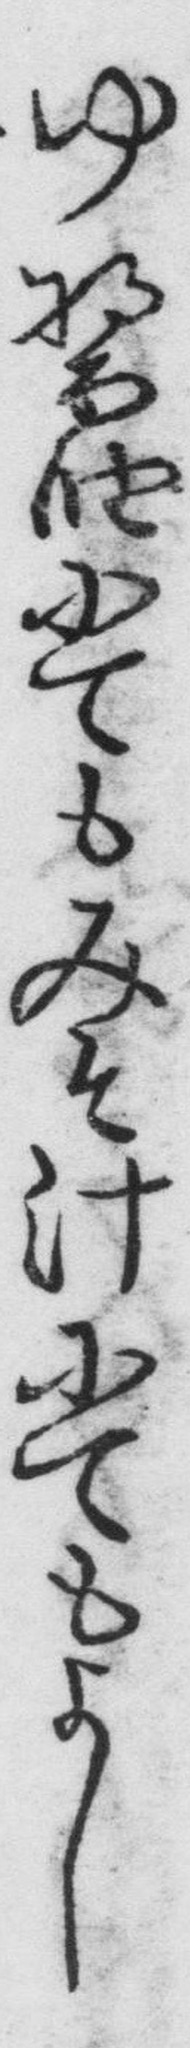ゆ醤油尓てもみそ汁尓てもよし
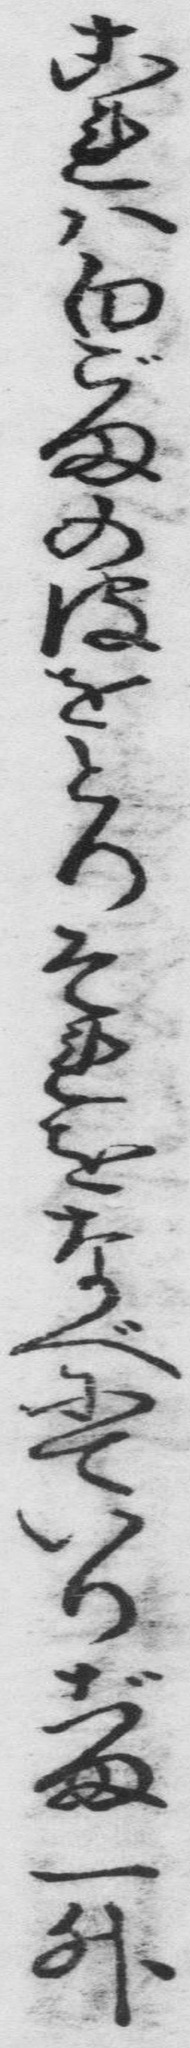古連は白ご満の皮をとりそ連をなべ尓ていりご満一升
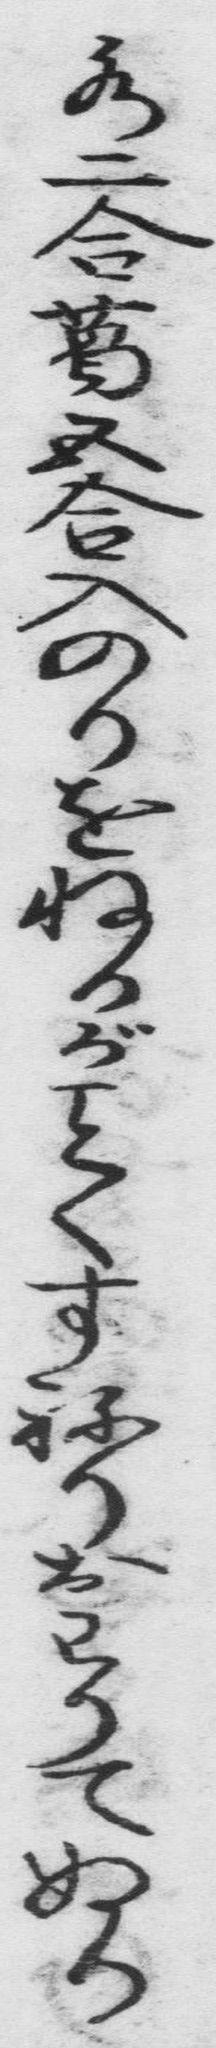水二合葛五合入のりをねるごとくす祢りおわりてぬり
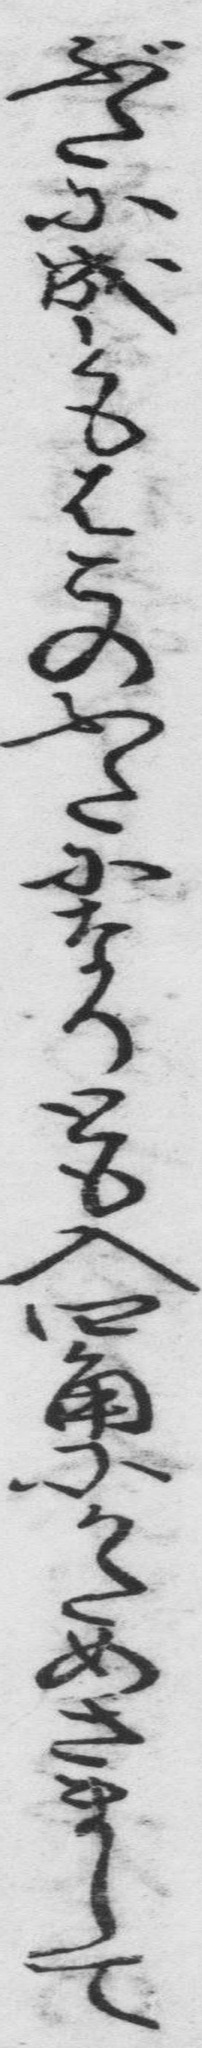ぶた尓成ともはこのふた尓なりとも入口角尓かためさまして
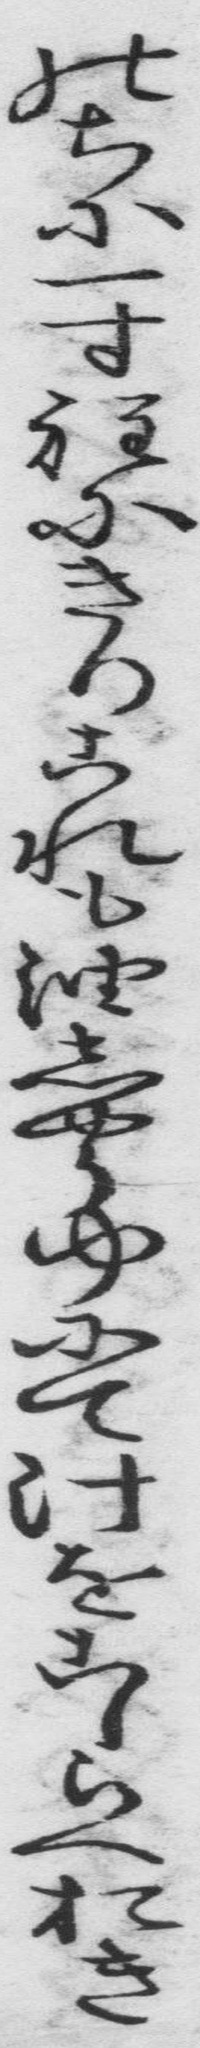能ち尓一寸程尓きり古れも油志やうゆ尓て汁を古しらへ於き
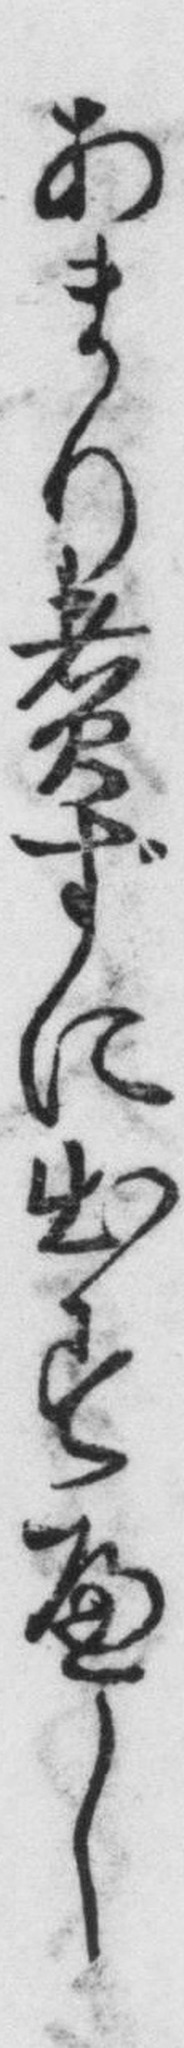あまり煮ずに出春扁し
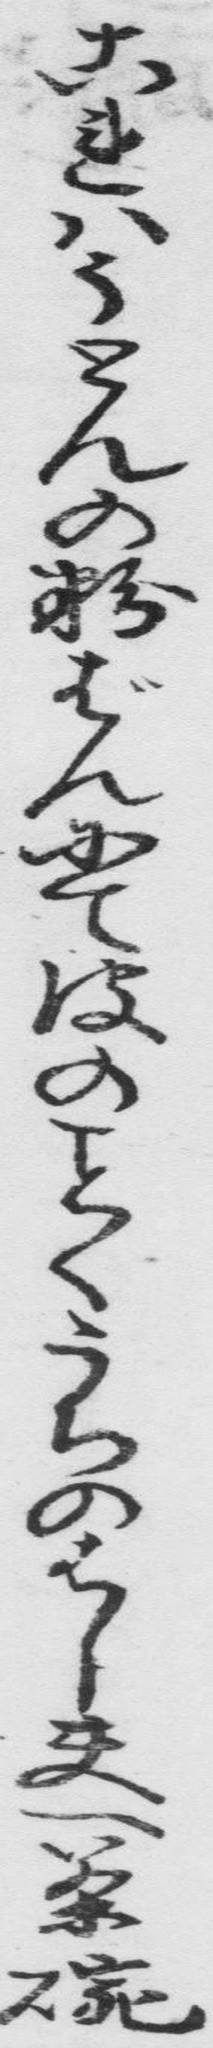古連はうとんの粉ばん尓て皮のことくうちのはし夫へ茶碗
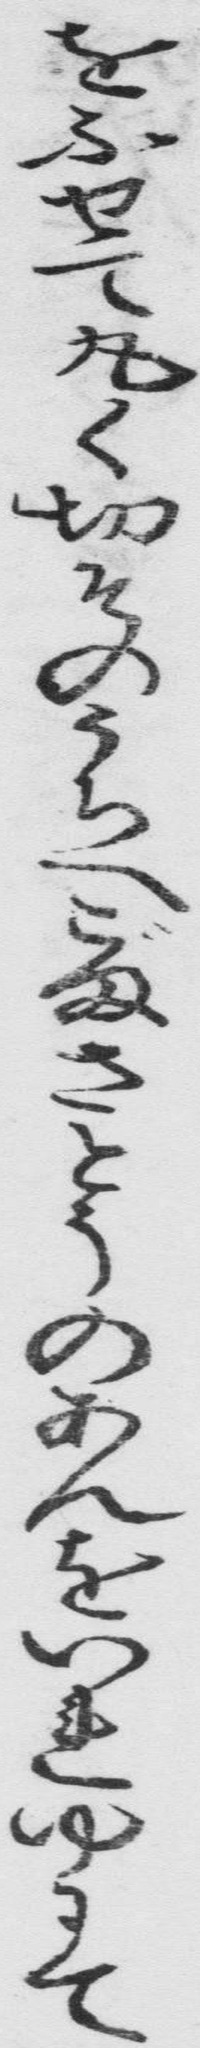をふせて丸く切そのうちへご満さとうのあんをい連ゆ尓て
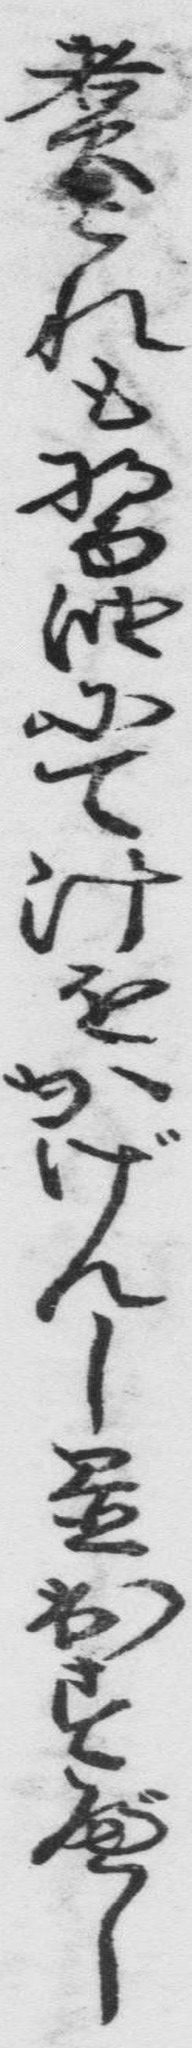煮これも醤油尓て汁をかげんし置出春べし
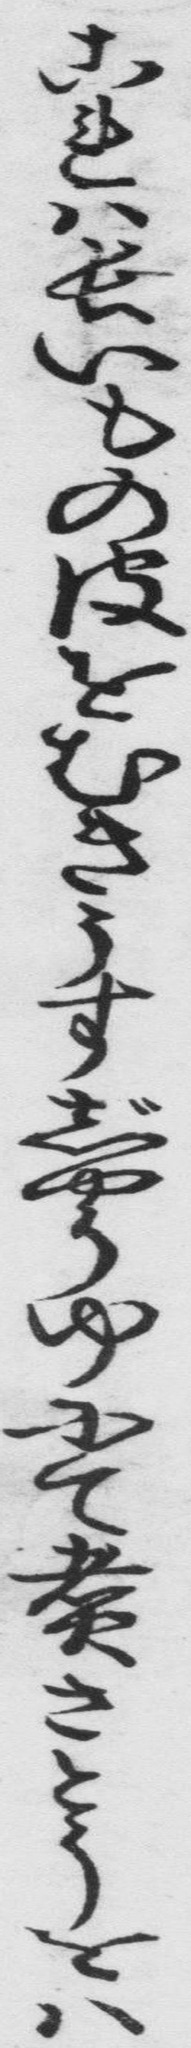古連は長いもの皮をむきうすじやうゆ尓て煮さとうをは
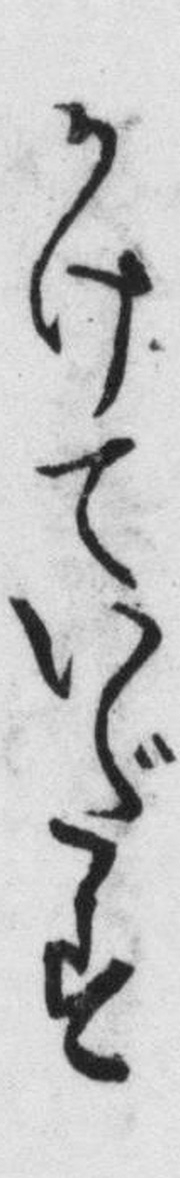かけていだ春
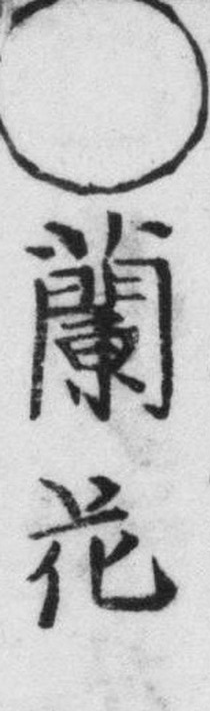〇蘭花
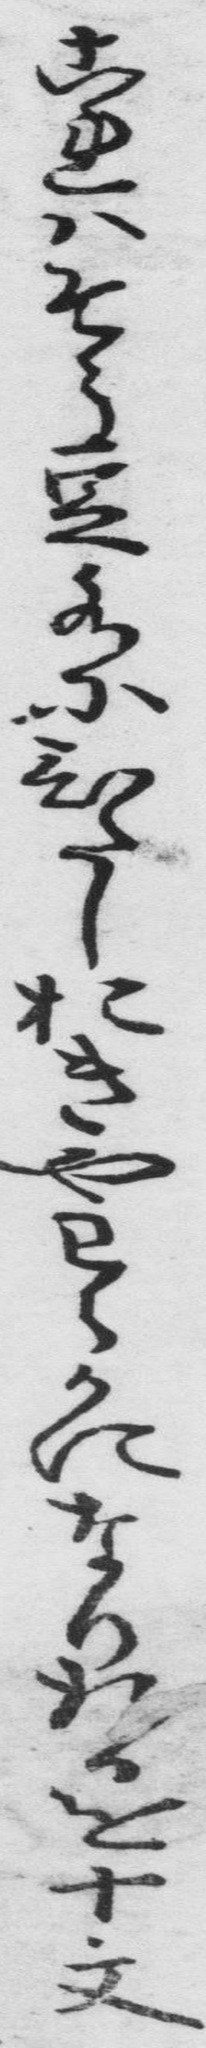古連はそら豆水尓飛たし於きやわらかになりたるを十文
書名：普茶料理抄
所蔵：大阪府立大学学術情報センター 国文学研究資料館
